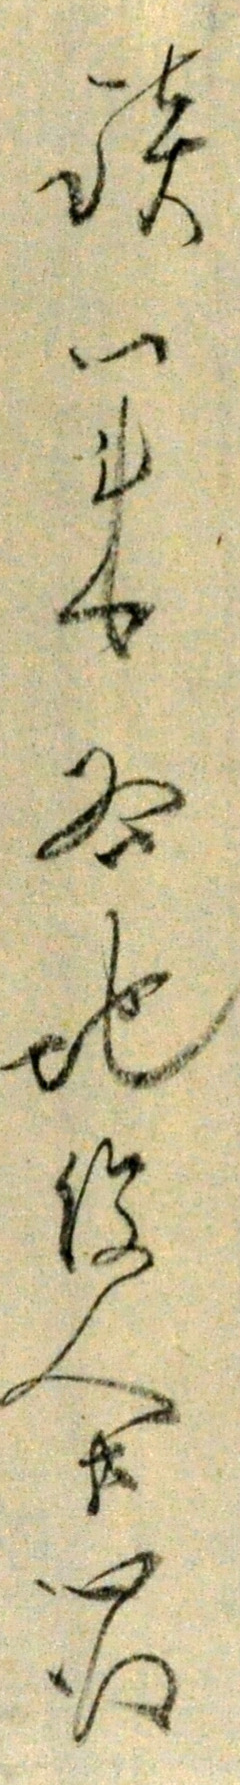談以来各地役人共心得
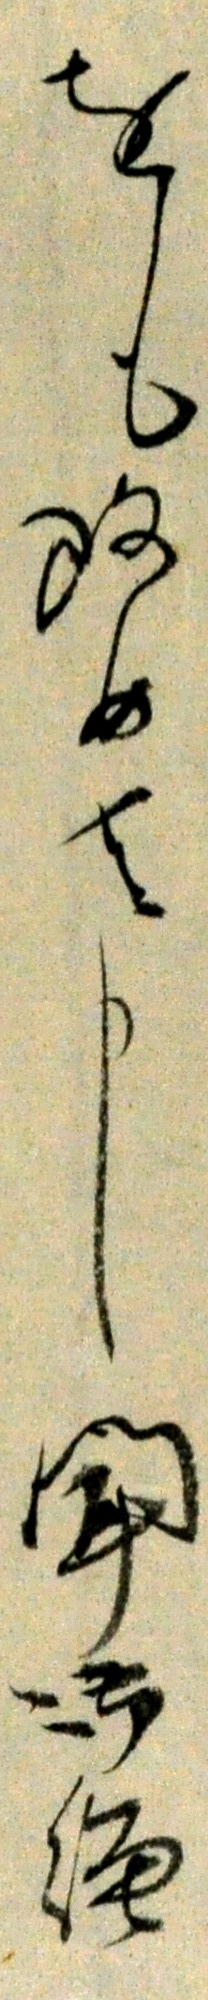をも改めて申し聞御贈
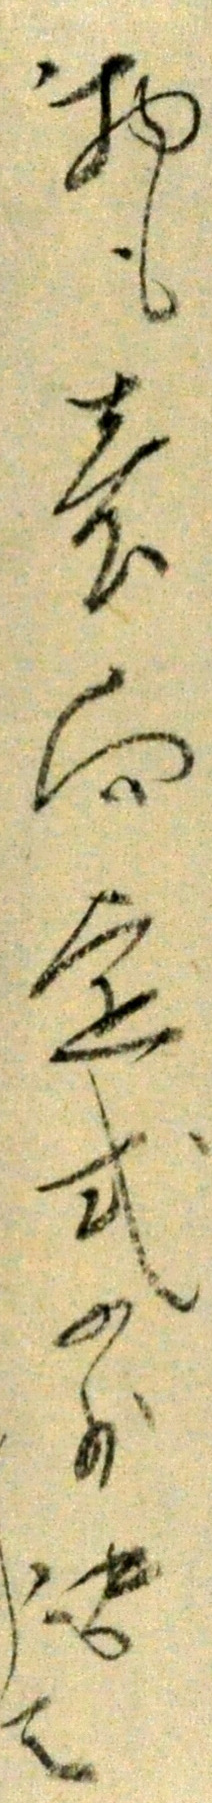物も表向定式の外決して
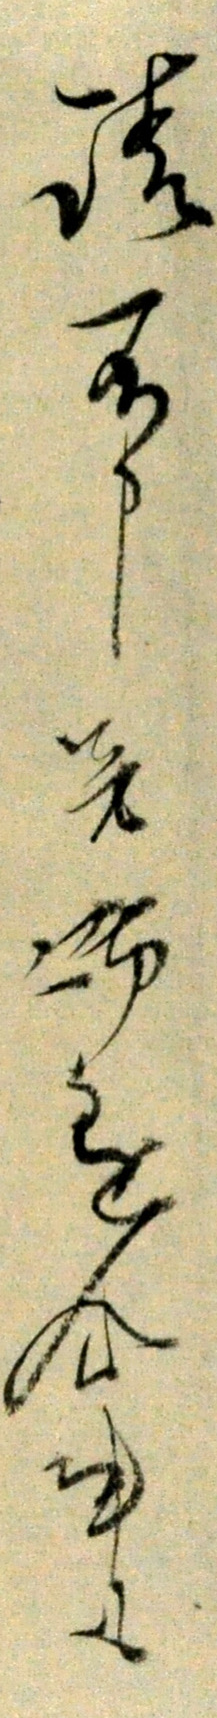請不申并御懸合事も
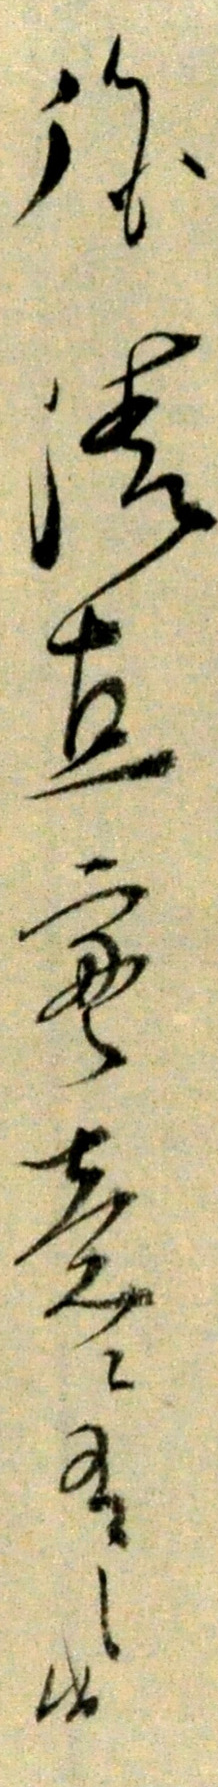弥清直実意ニ有之候
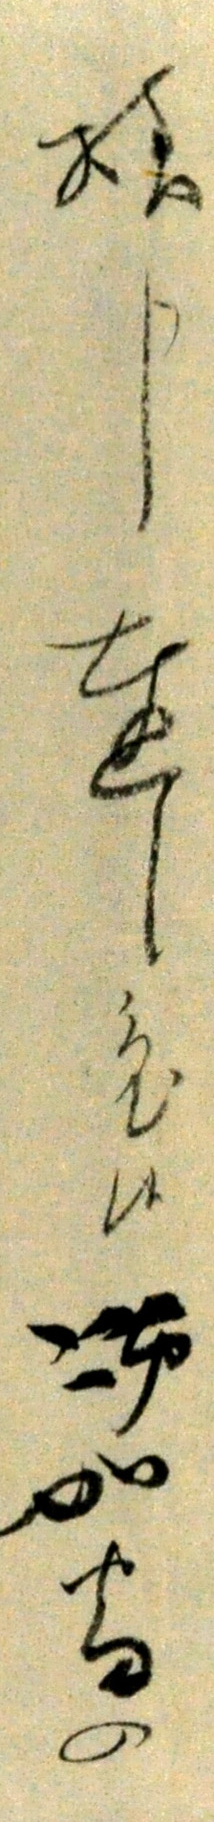様申し達し置候御加番の
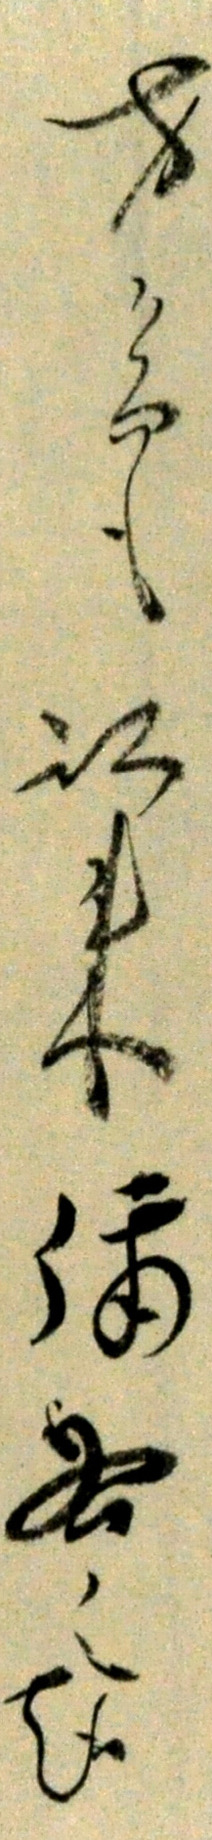方ニ而も以来弥右之趣

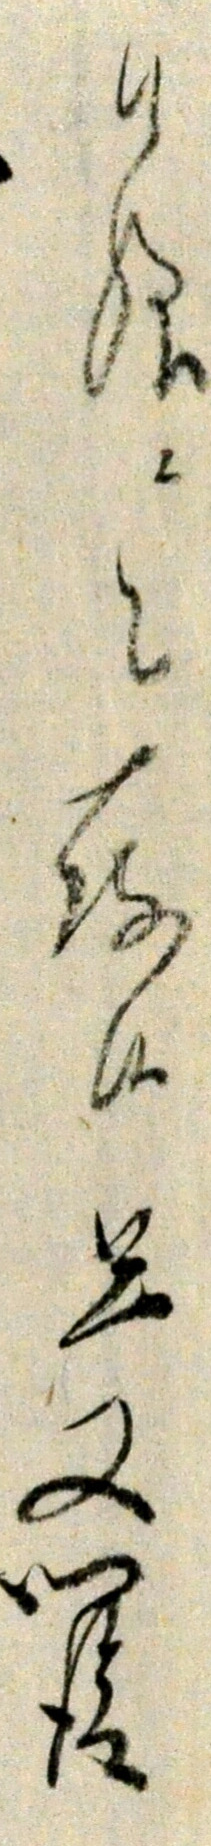候様ニも存候且又以後
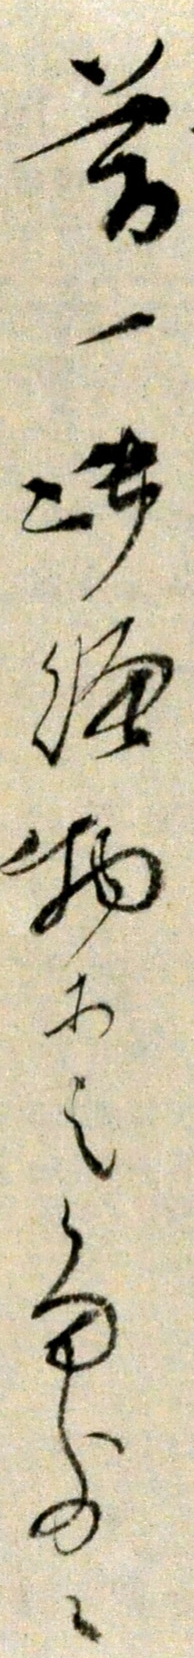万一御贈物等之多少ニ
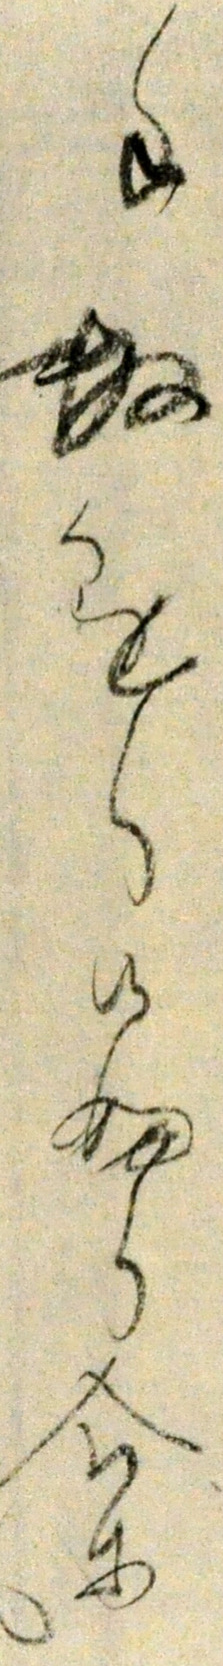手数懸り候ふり合等も
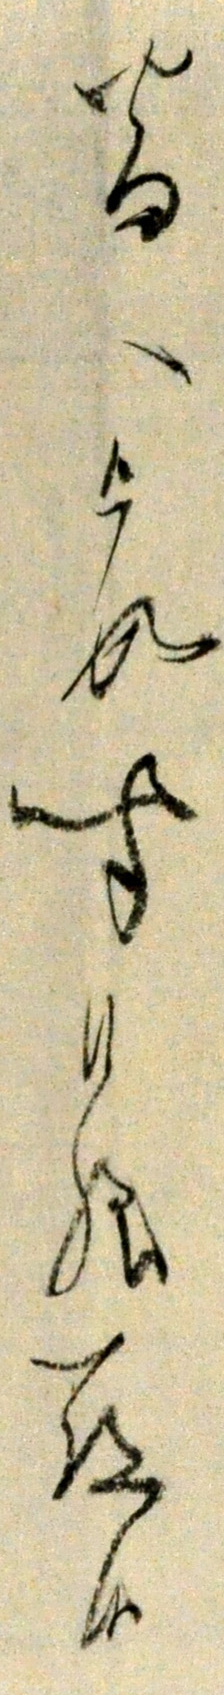番へ被仰聞候様存候
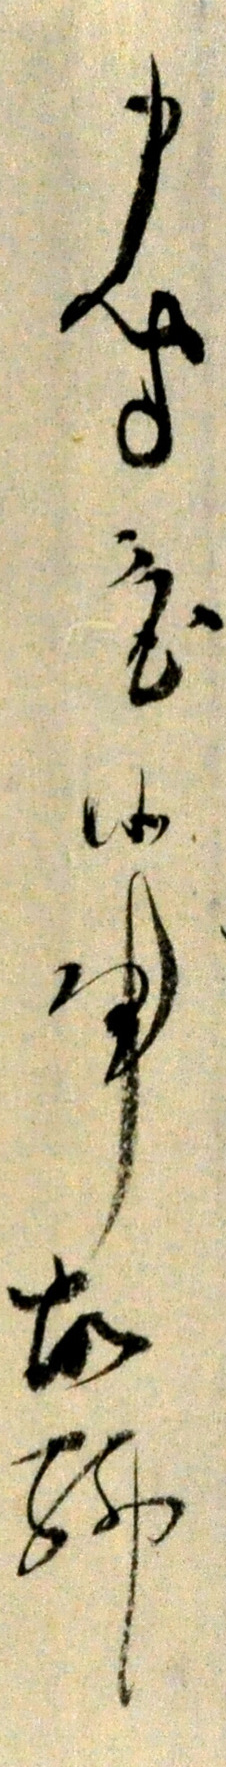申聞置候事故聊
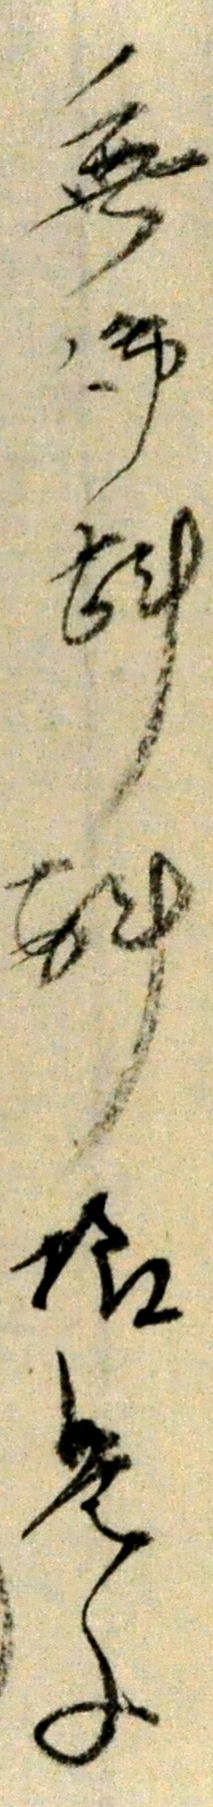無御斟酌様是の
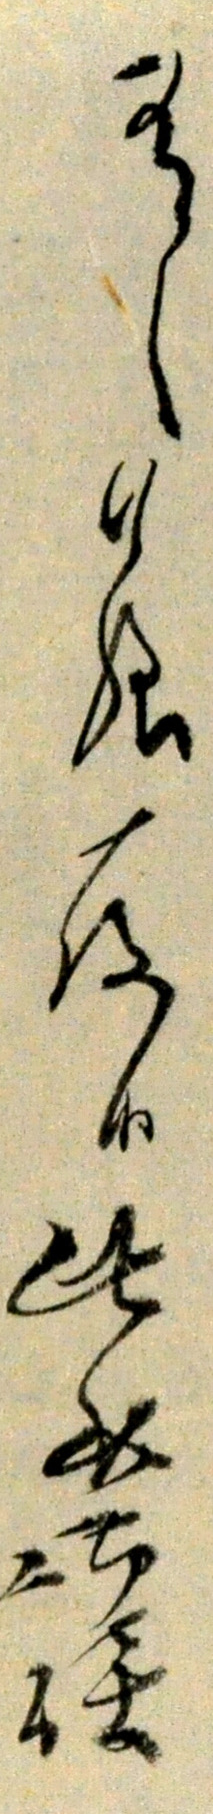有之候様存候此段御談
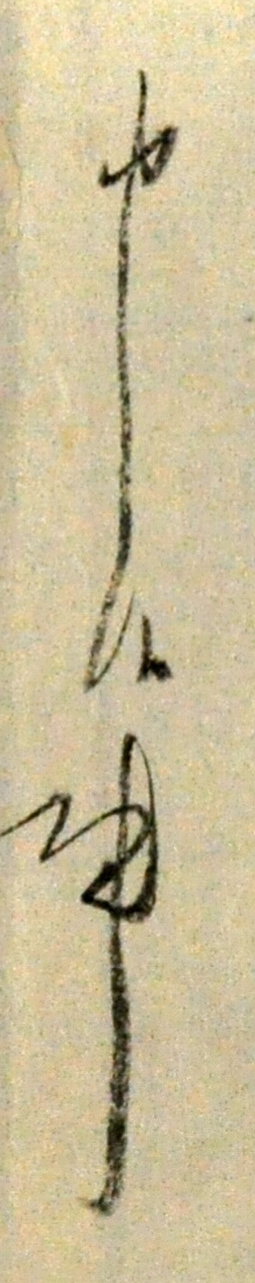申候事

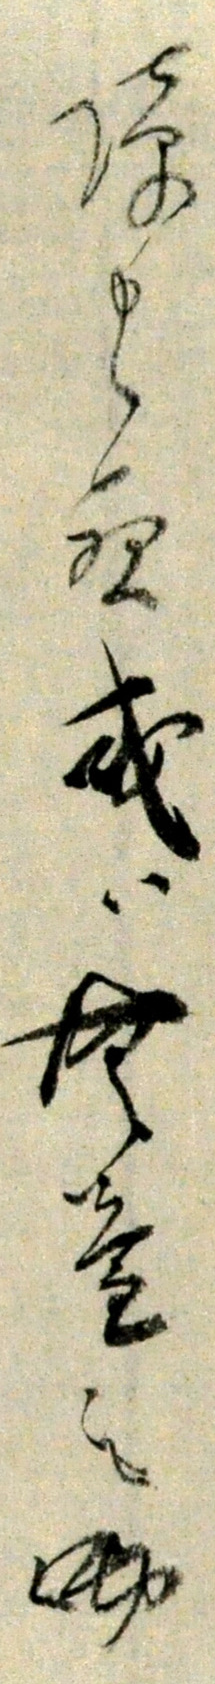障申候歟或ㇵ無量之働
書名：大阪加番関係諸書留〔一括〕
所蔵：伊那市立高遠町図書館・合同会社AMANE
